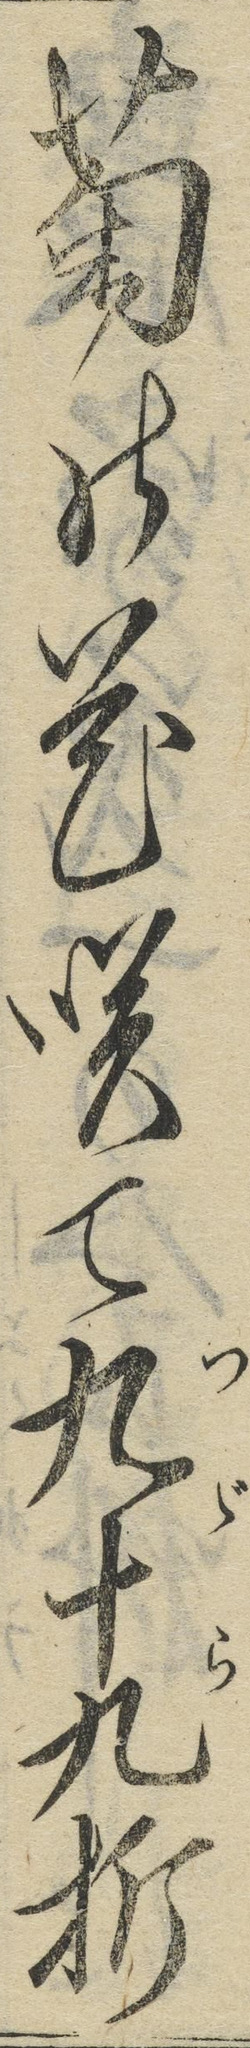菊の花咲て九十九折
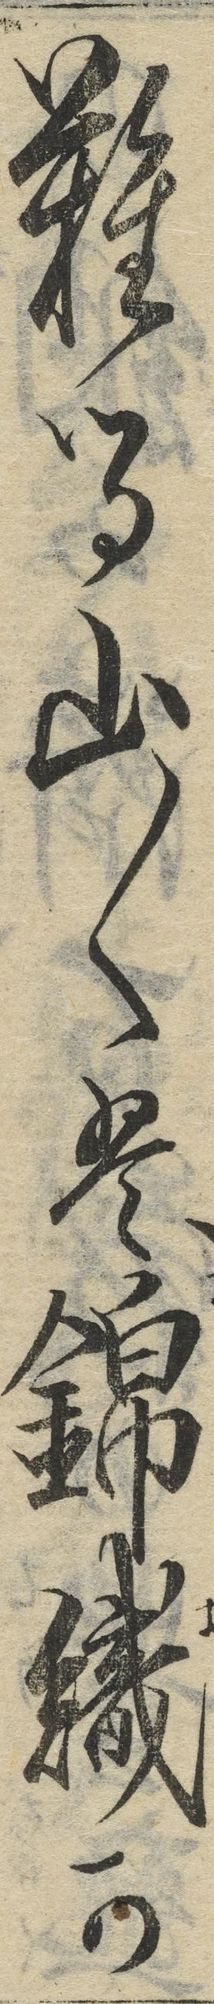なる山〱は、錦織か
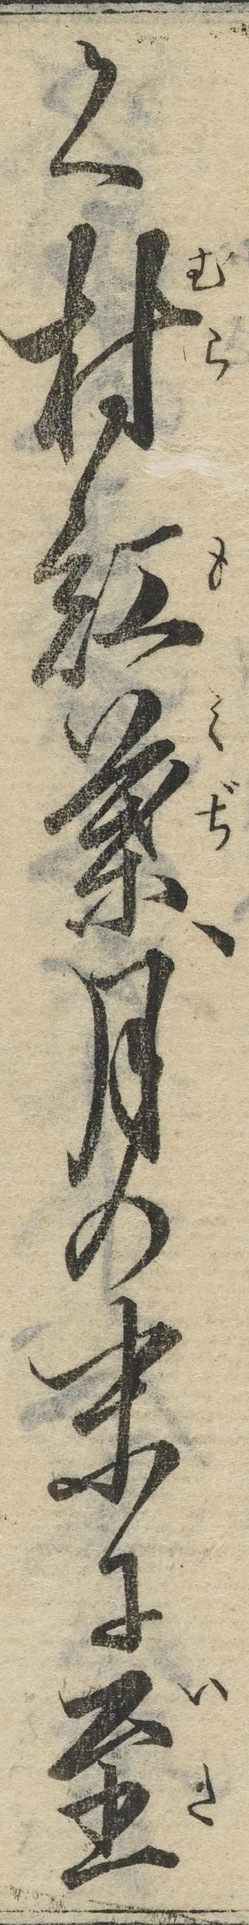く村紅葉、月の末に至
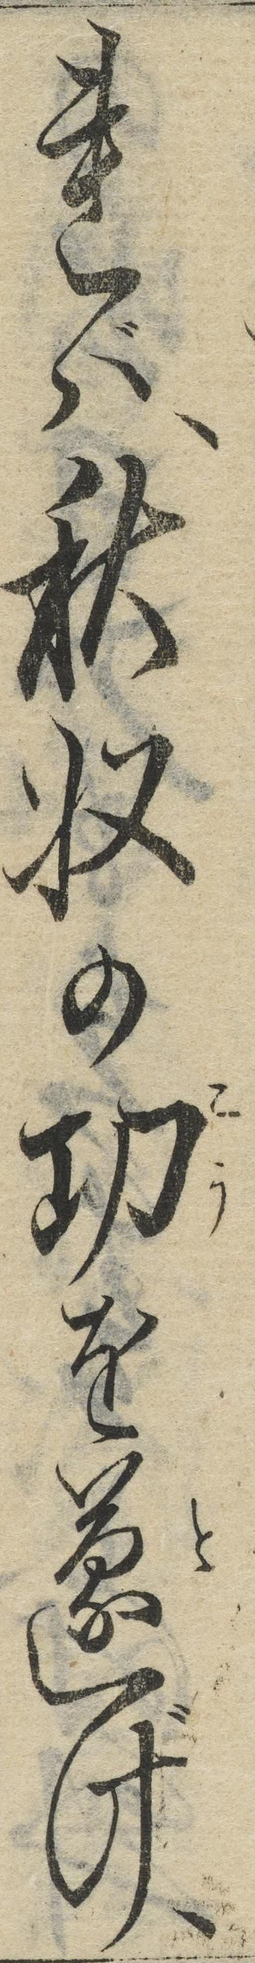れば、秋収の功を遂げ、
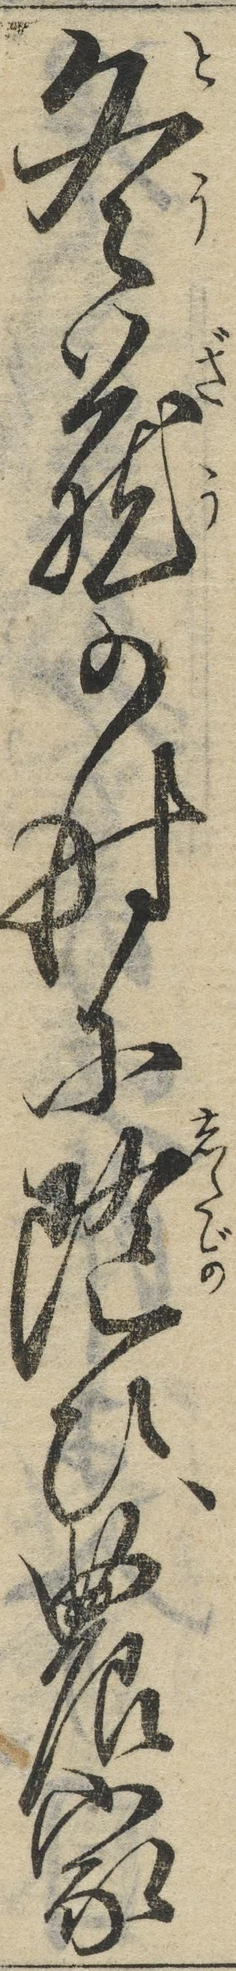冬蔵の時に随ひ、農家
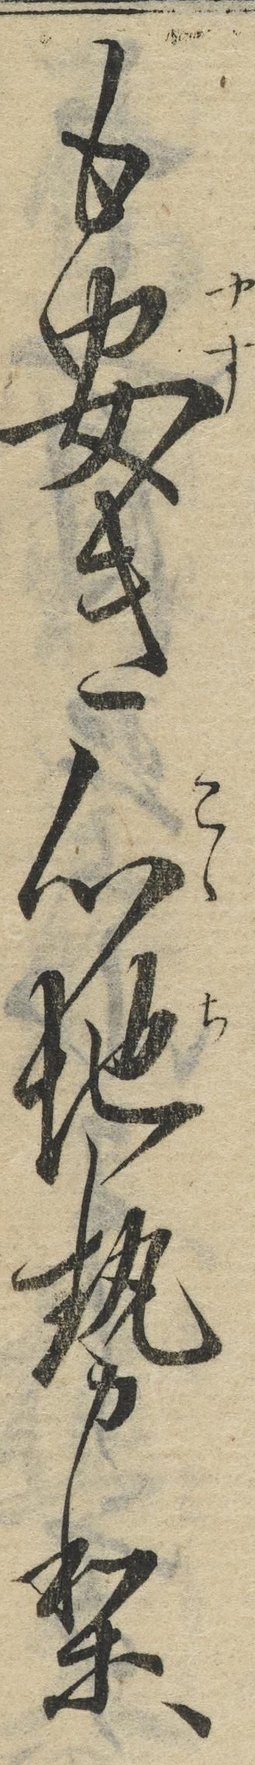も安き心地せり、

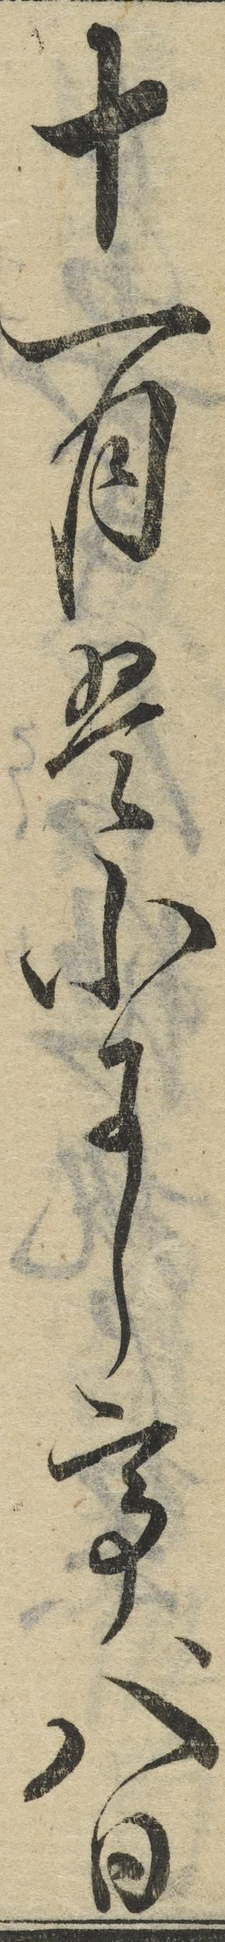十一月は、小にして、八日
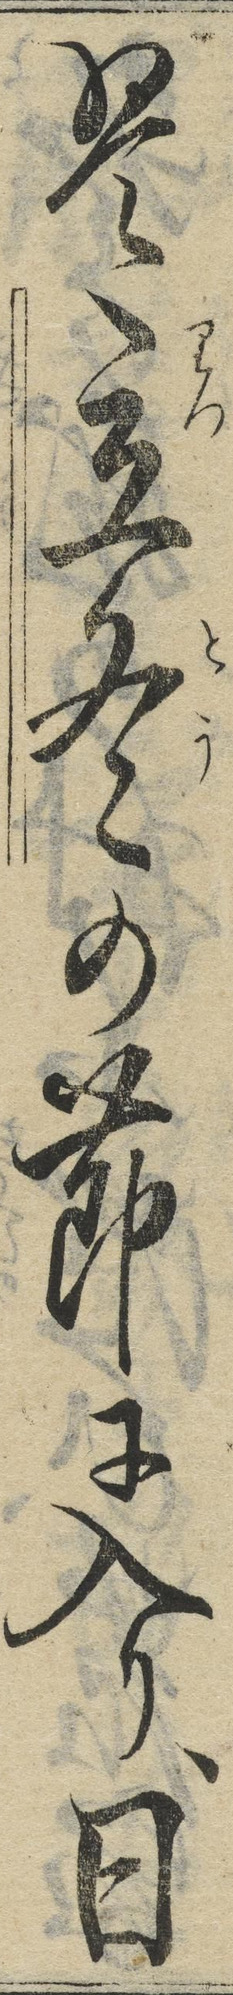は立冬の節に入り、日
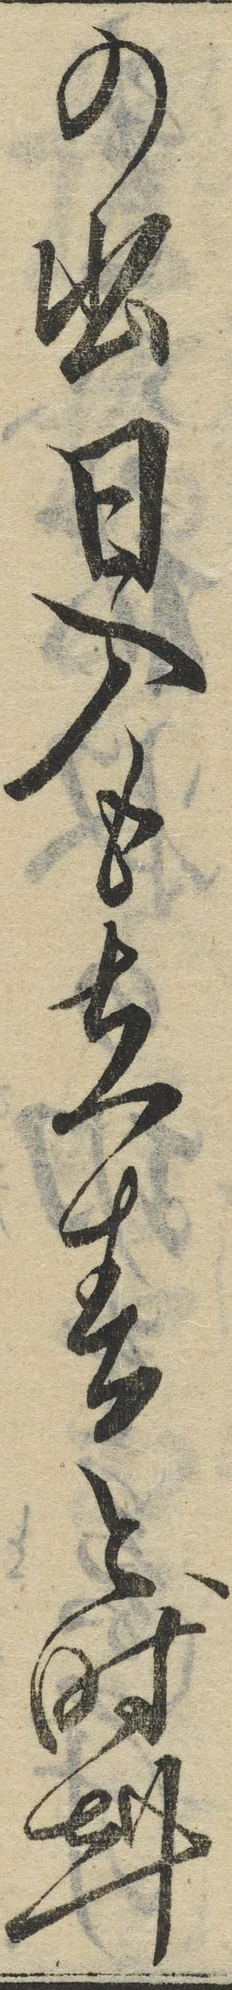の出日入も立春と、時刻
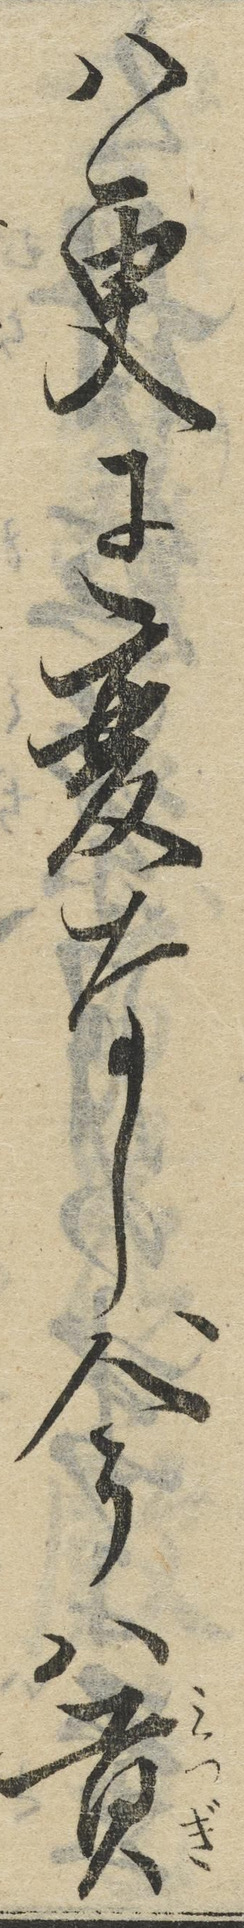は更に変なし、今は貢
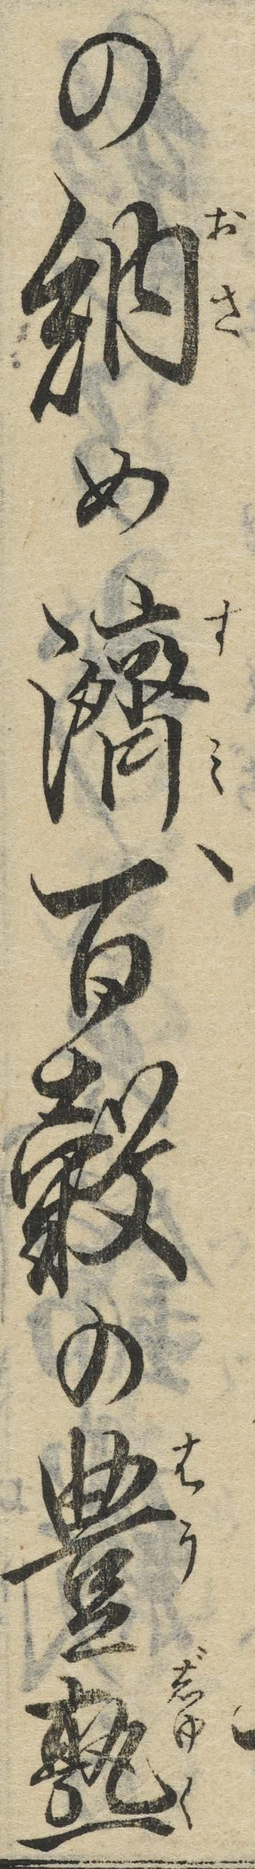の納め済、百穀の豊熟
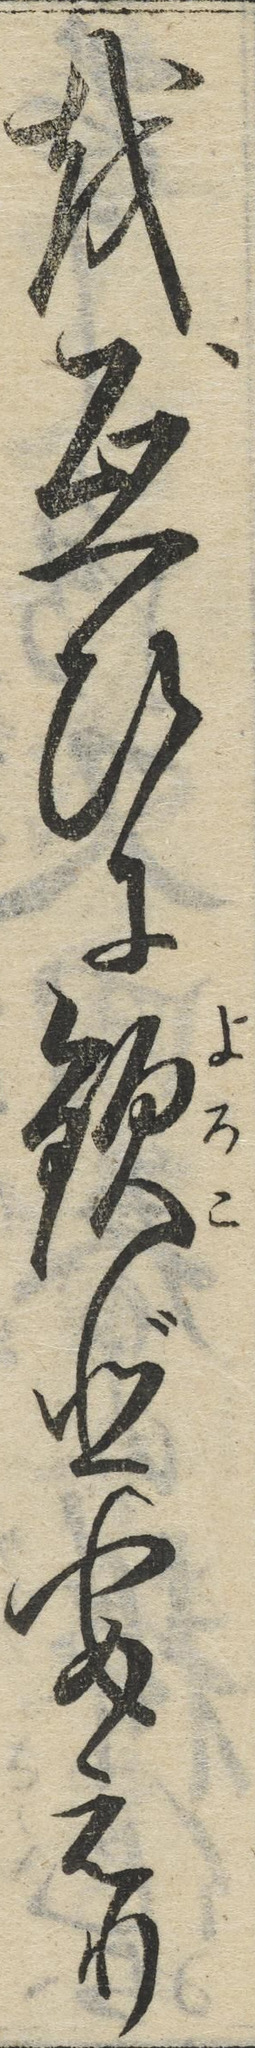を、互に歓びあえり
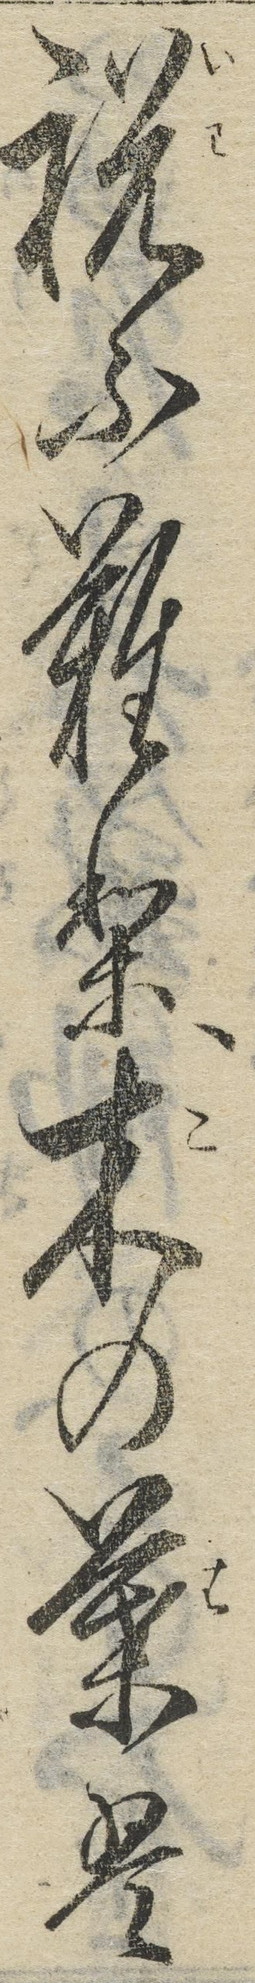祝ふなり、木の葉は
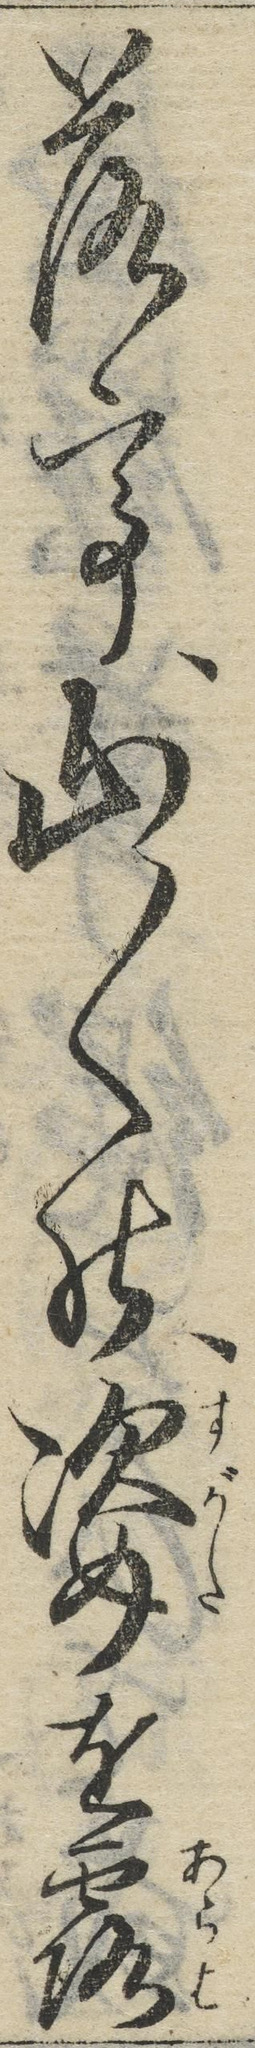落て、山〱の、姿を露
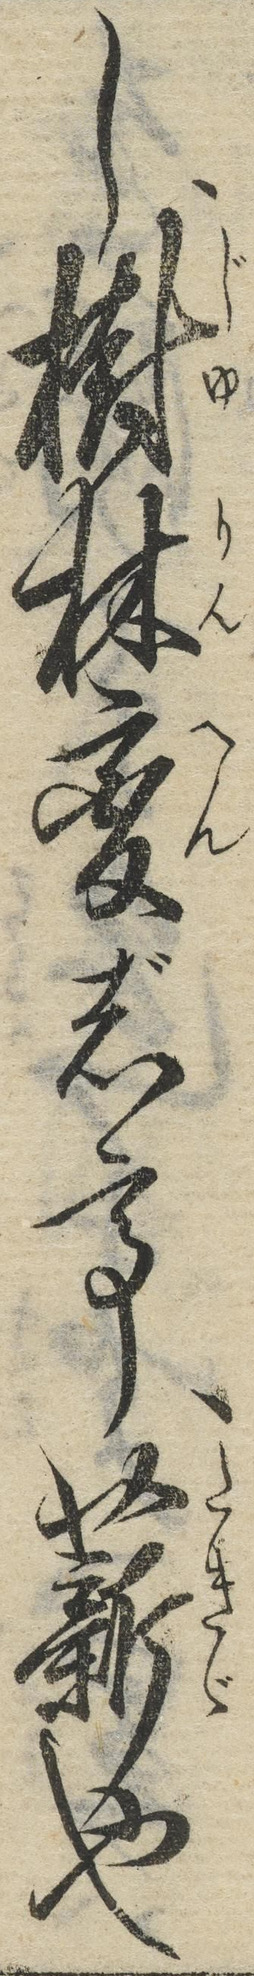し、樹林変じて、薪や
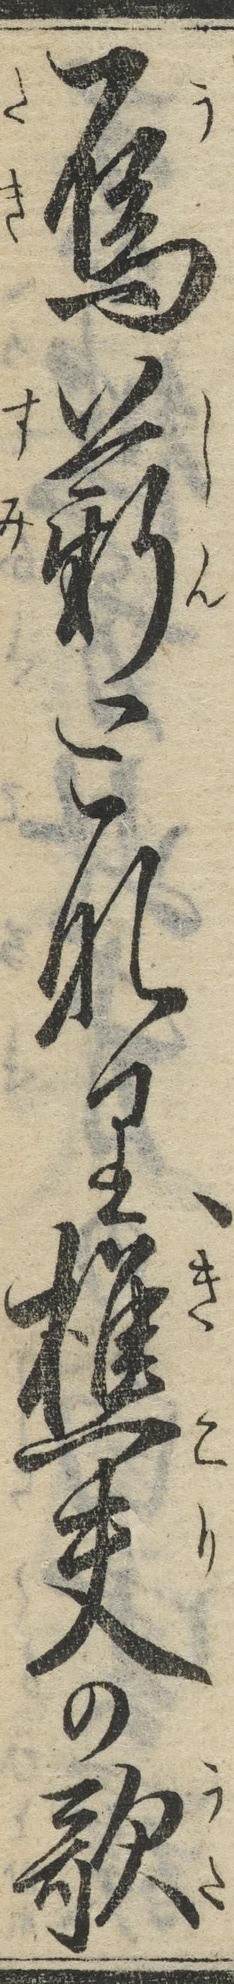烏薪となり、樵夫の歌
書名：暦日往来　單
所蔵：東京大学地震研究所図書室 Earthquake Research Institute Library, The University of Tokyo, JAPAN
